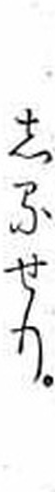しるせり。
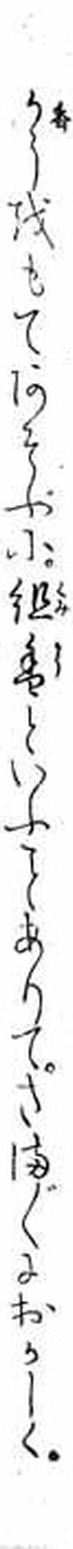かうをもてあそぶに。組香といふことありて。さま〴〵におかしく。
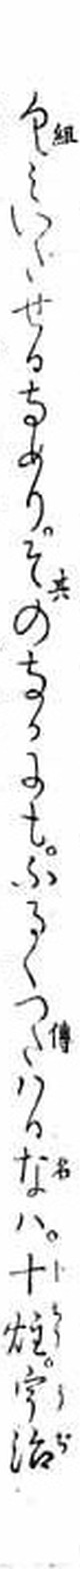くみいだせるなめり。そのなかにも。ふるくつたはるなは。十炷。宇治
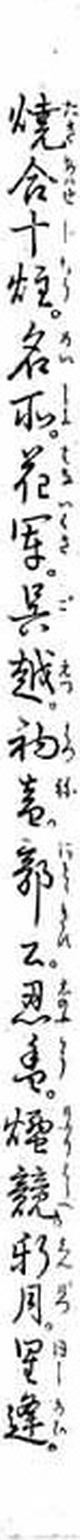焼合十炷。名所。花軍。呉越。初音。郭公。忍香。煙競。新月。星逢。
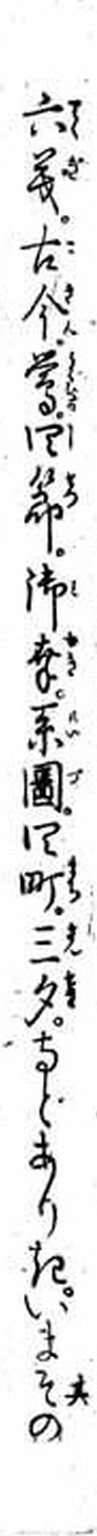六義。古今。鴬。四節。御幸。系図。四町。三夕。などありき。いまその
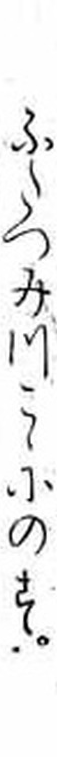ふたつみつこゝにのす。
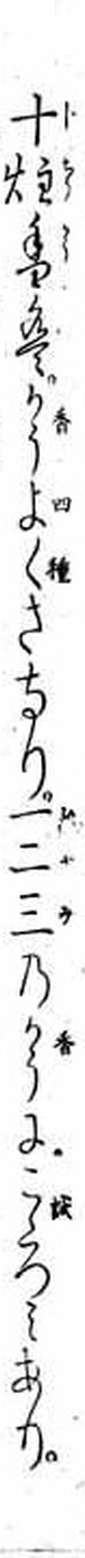十炷香は。かうよくさなり。一二三のかうに。こゝろみ
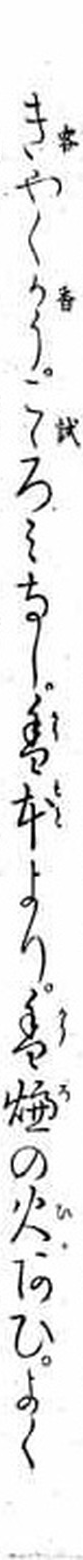きやくかう。こゝろみなし。香本より。香炉の火あひ。よく
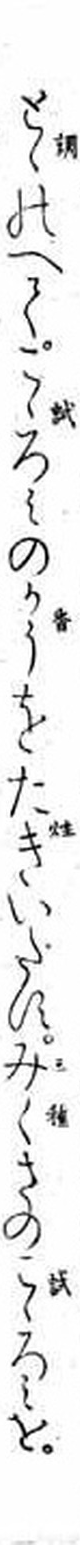とゝのへて。こゝろみのかうをたきいだす。みくさのこゝろみを。
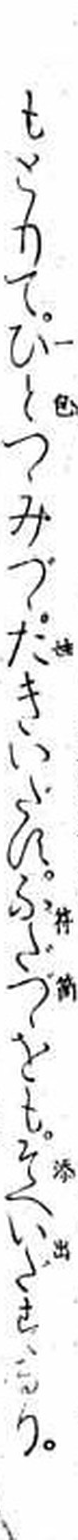もとりて。ひとつゝみづゝ。たきいだす。ふだづゝをも。そへいだすなり。
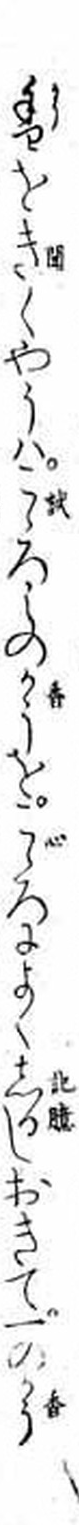香をきくやうは。こゝろみのかうを。こゝろによくしるしおきて。一のかう
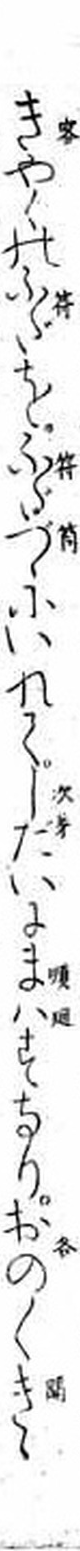きやくのふだを。ふだづゝにいれて。しだいにまはすなり。おの〳〵きゝ
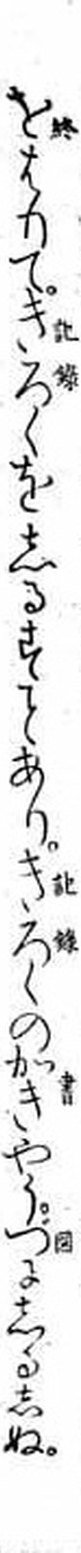をはりて。きろくをしるすことあり。きろくのかきやう。つにしるしぬ。

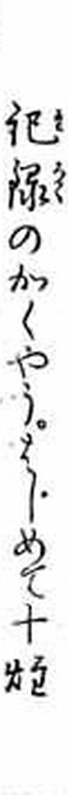記録のかくやう。はじめて十炷
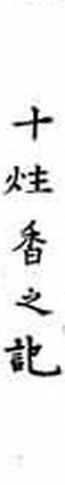十炷香之記
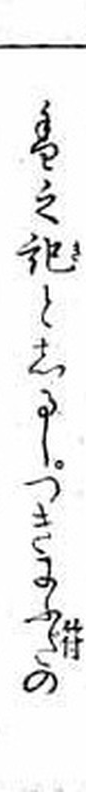香之記としるし。つきにふだの
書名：女学範
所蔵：東京学芸大学教育コンテンツアーカイブ
